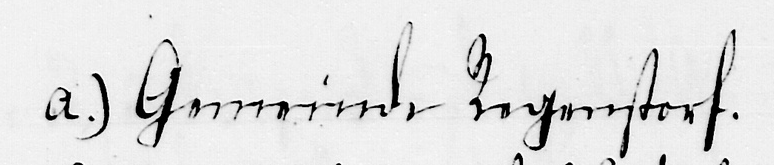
a.) Gemeinde Regenstorf.
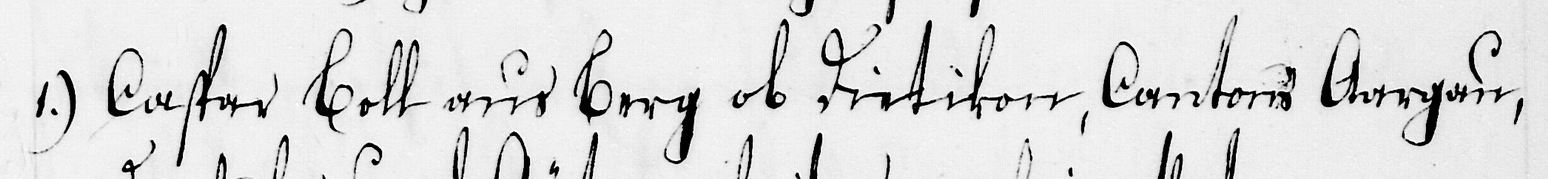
1.) Caspar Boll aus Berg ob Dietikon, Cantons Aargau,
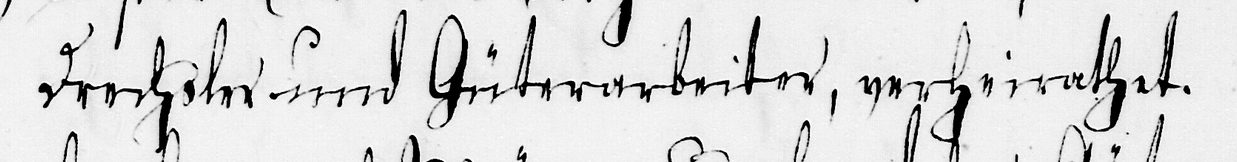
Drechsler und Güterarbeiter, verheirathet.
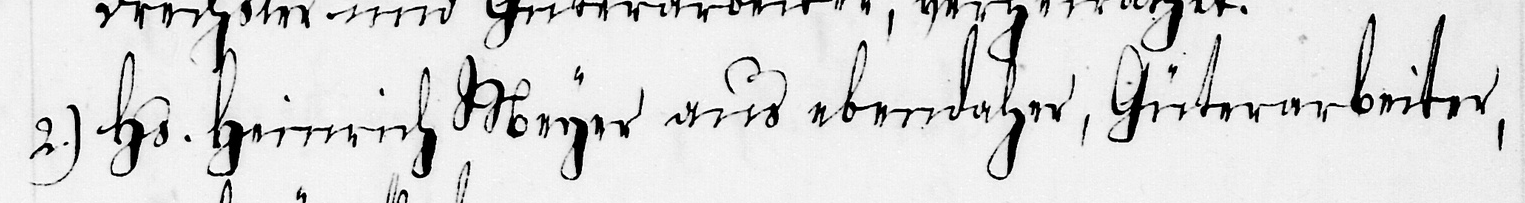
2.) Hs. Heinrich Meyer aus ebendaher, Güterarbeiter,
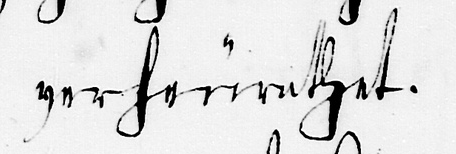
verheurathet.
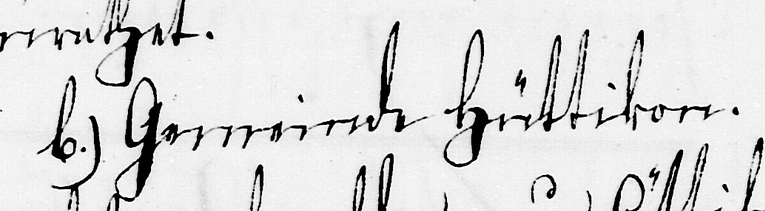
b.) Gemeinde Hüttikon.
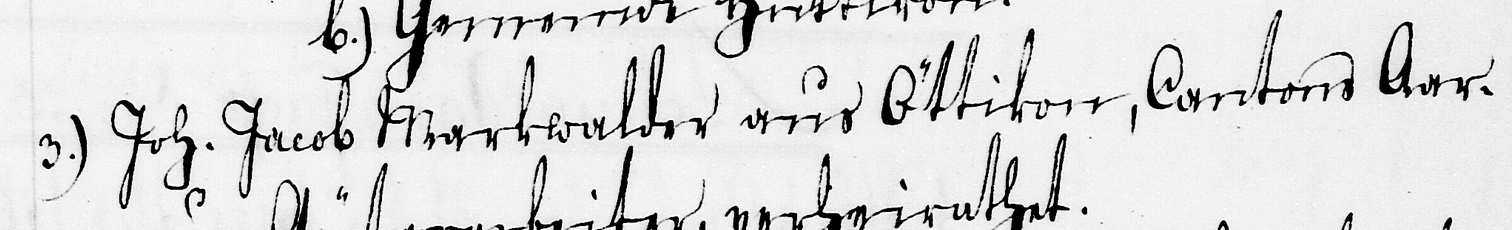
3.) Joh. Jacob Markwalder aus Öttikon, Cantons Aar¬
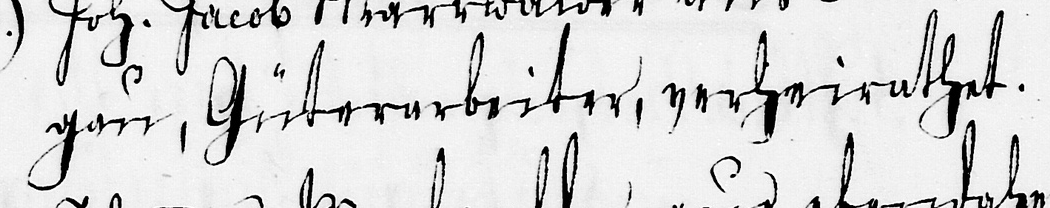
gau, Güterarbeiter, verheirathet.
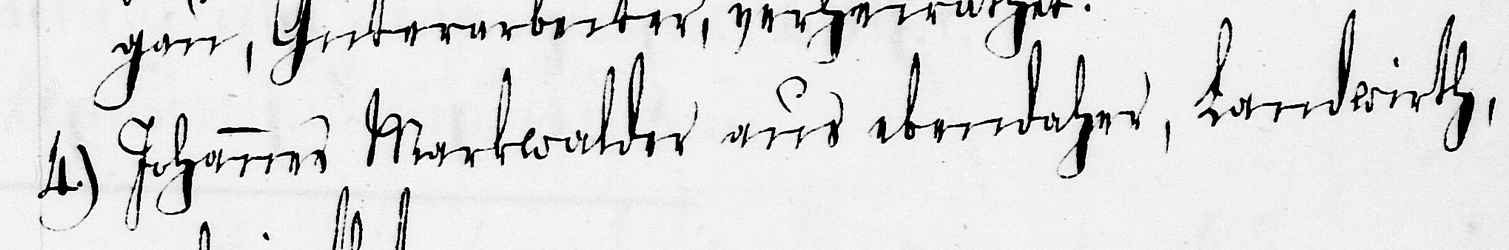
4.) Johannes Markwalder aus ebendaher, Landwirth,
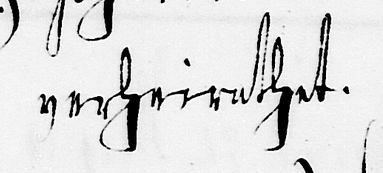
verheirathet.
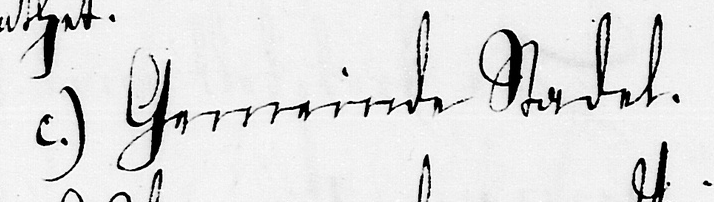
c.) Gemeinde Stadel.
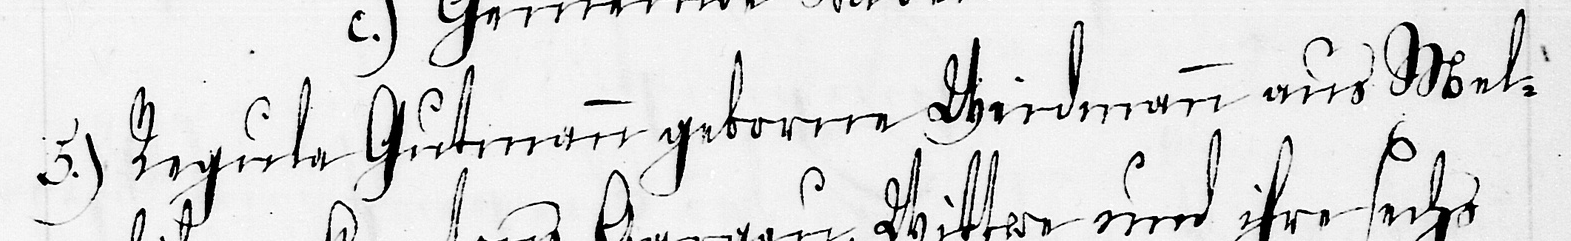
5.) Regula Gutmann geborne Weidmann aus Mel¬
